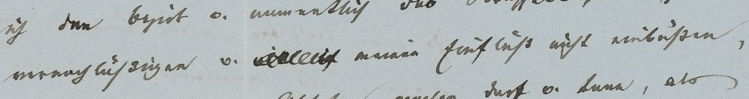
vernachläßigen &. wie ich meinen Einfluß nicht einbüßen,
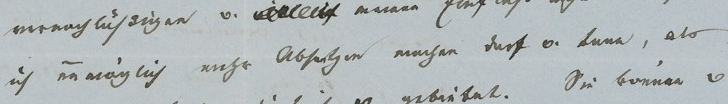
ich unmöglich mehr Absentzen machen darf &. kann, als
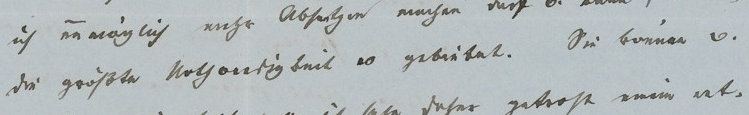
die größte Nothwendigkeit es gebietet. Sie können &.
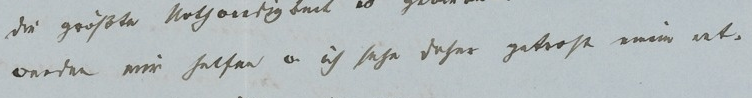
werden mir helfen &. ich sehe daher getrost einem ent-
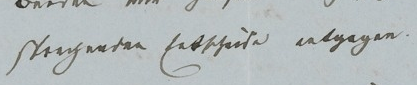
sprechenden Entscheide entgegen.
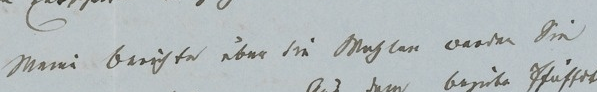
Meine Berichte über die Wahlen werden Sie
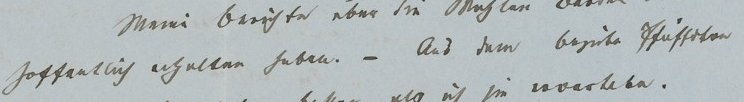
hoffentlich erhalten haben. – Aus dem Bezirke Pfäffikon
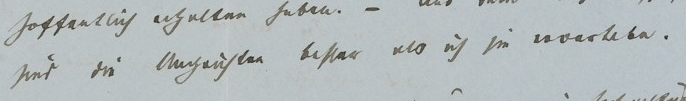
sind die Nachrichten besser als ich sie erwartete.
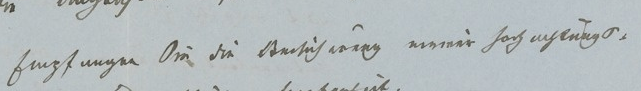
Empfangen Sie die Versicherung meiner hochachtungs-
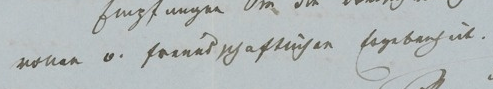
vollen &. freundschaftlichen Ergebenheit.
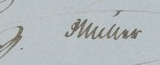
J. Müller
